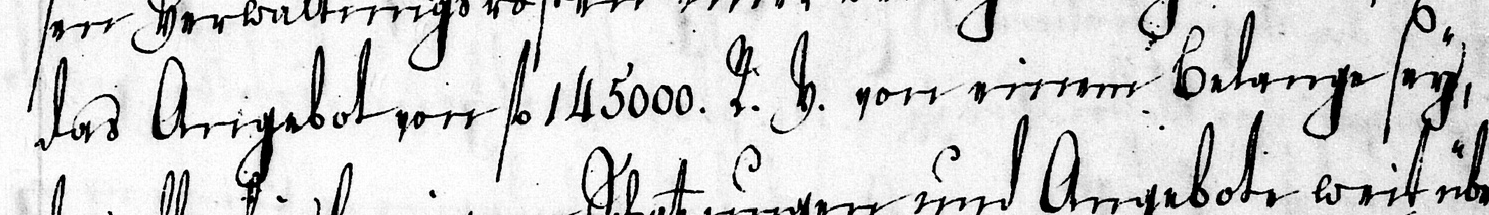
das Angebot von fl 145‘000 R. V. von einem Belange sey,
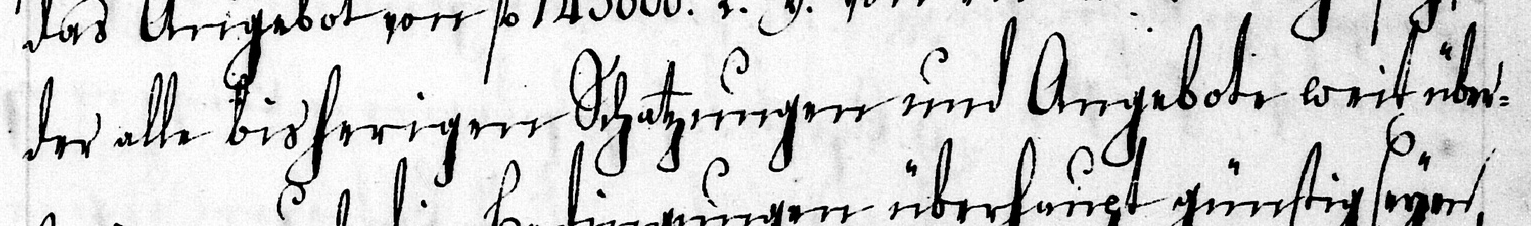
der alle bisherigen Schatzungen und Angebote weit über¬
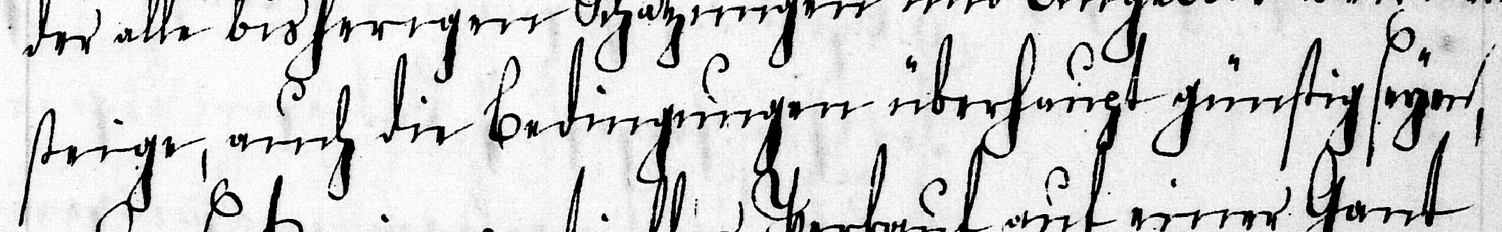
steige, auch die Bedingungen überhaupt günstig seyen,
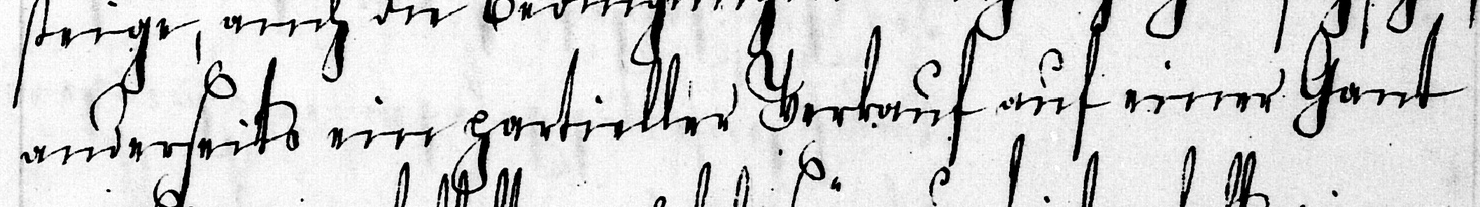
anderseits ein partieller Verkauf auf einer Gant
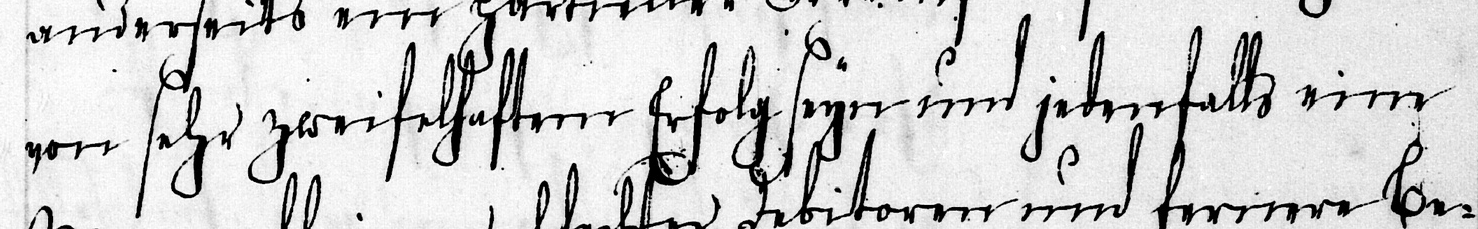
von sehr zweifelhaftem Erfolg seyn und jedenfalls eine
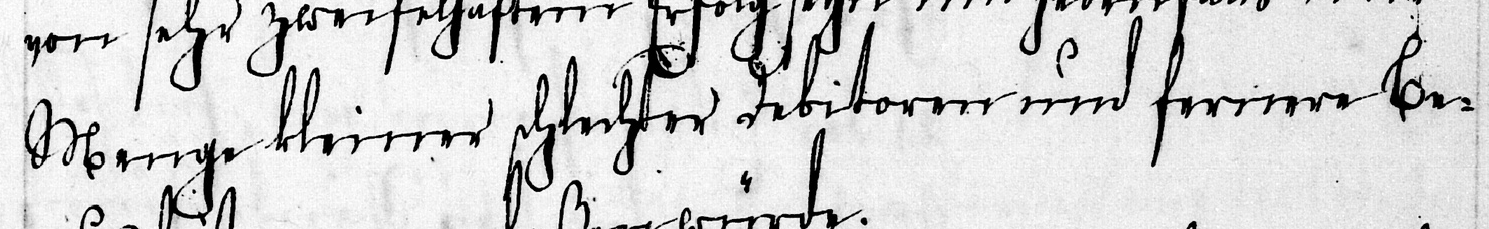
Menge kleiner schlechter Debitoren und fernere Be¬
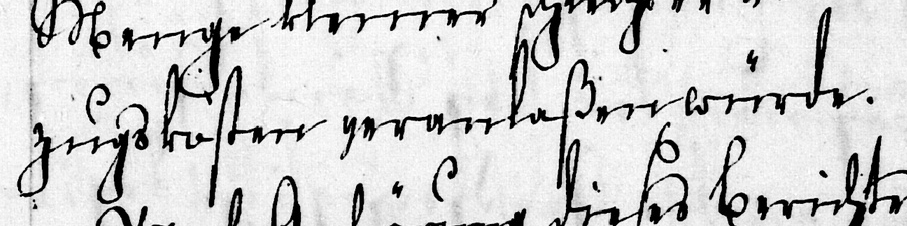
zugskosten veranlaßen würde.
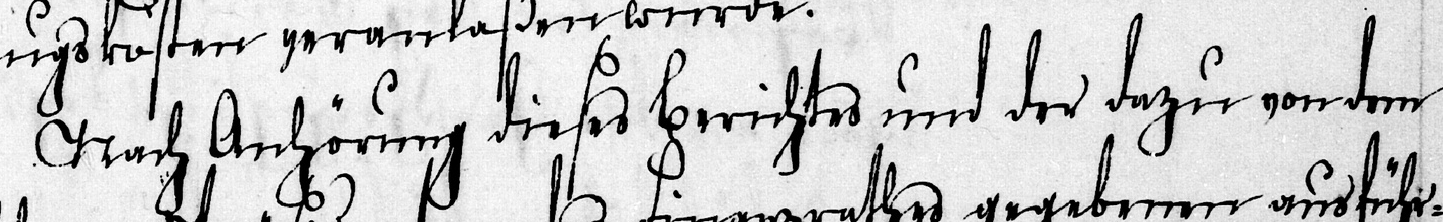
Nach Anhörung dieses Berichtes und der dazu von dem
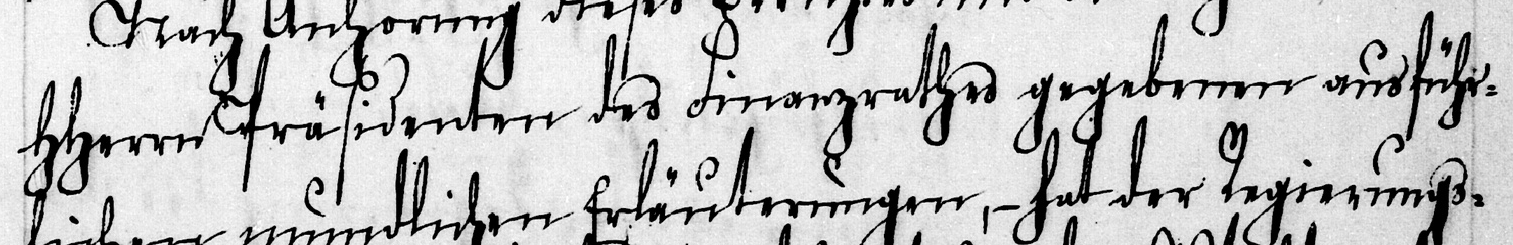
HHerrn Präsidenten des Finanzrathes gegebenen ausführ¬
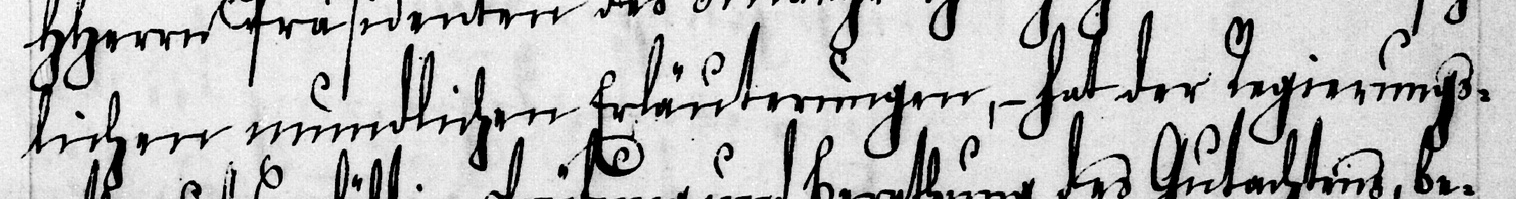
lichen mundlichen Erläuterungen, – hat der Regierungs¬
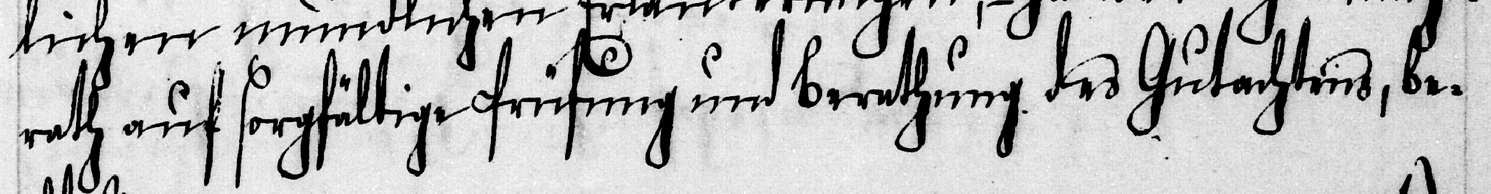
rath auf sorgfältige Prüfung und Berathung des Gutachtens, be¬
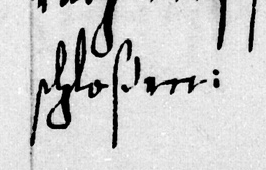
schloßen:
